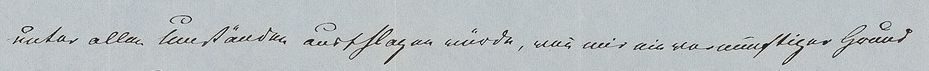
unter allen Umständen ausschlagen würde, wenn mir ein vernünftiger Grund
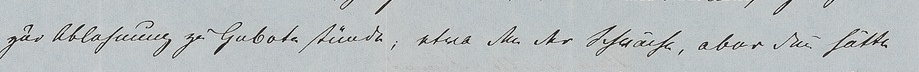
zur Ablehnung zu Gebote stünde; etwa den der Schwäche, aber dann hätte
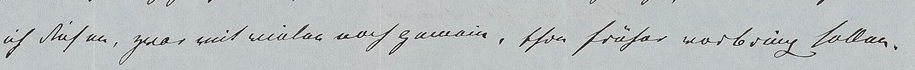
ich diesen, zwar mit vielen noch gemein, schon früher vorbringen sollen.
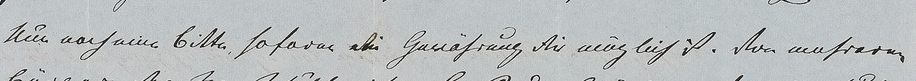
Nun noch eine Bitte, soferne die Gewährung Dir möglich ist. Von mehreren
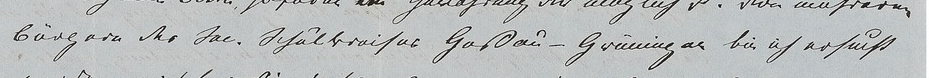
Bürgern des Sec. Schulkreises Goßau–Grüningen bin ich ersucht
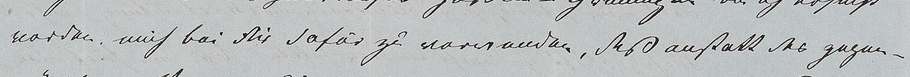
worden, mich bei Dir dafür zu verwenden, daß anstatt des gegen-
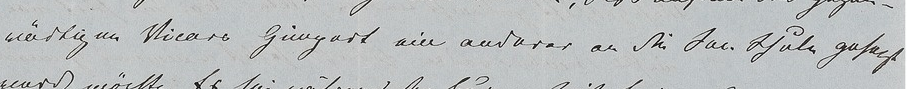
wärtigen Vicars Gimpert ein anderer an die Sec. Schule gesetzt
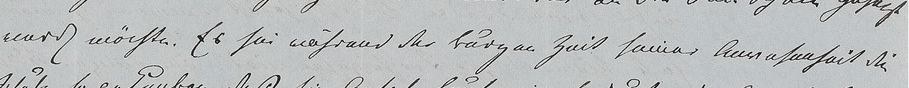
werden möchte. Es sei während der kurzen Zeit seiner Anwesenheit die
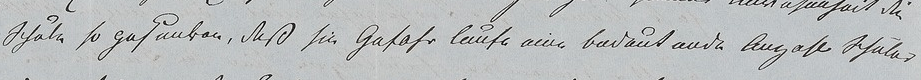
Schule so gesunken, daß sie Gefahr laufe eine bedeutende Anzahl Schüler
